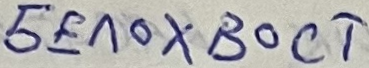белохвост
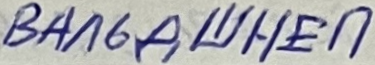вальдшнеп
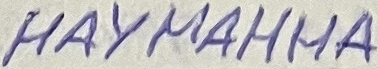науманна
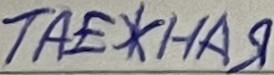таежная
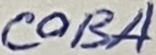сова
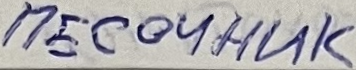песочник
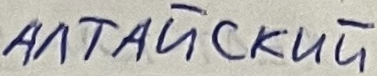алтайский
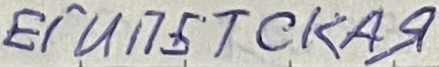египетская
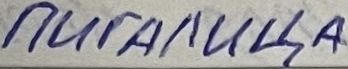пигалица
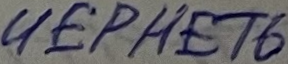чернеть
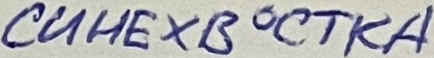синехвостка
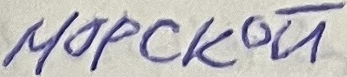морской
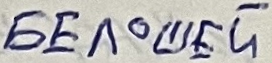белошей
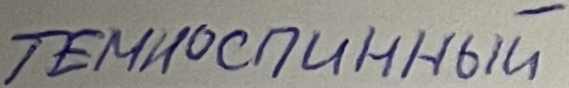темноспинный
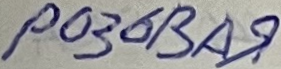розовая
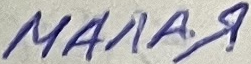малая
